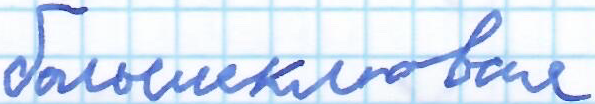большеклювая
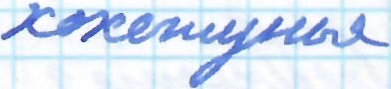хохотунья
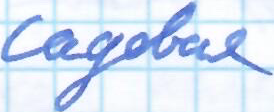садовая
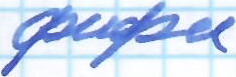фифи
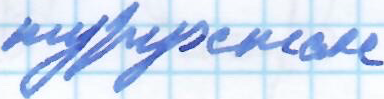турухтан
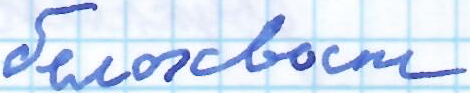белохвост
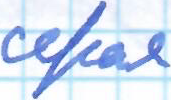серая
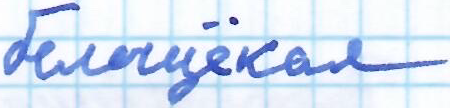белощёкая
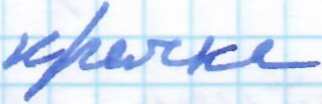крачка
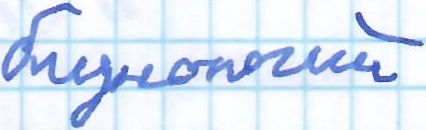бледноногий
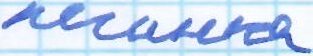пеганка
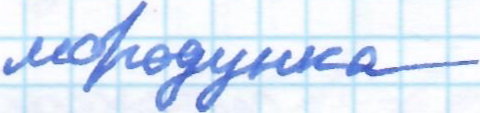мородунка
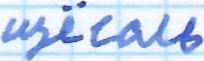щёголь
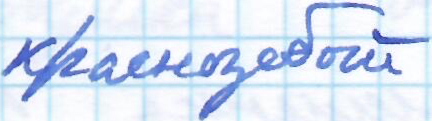краснозобый
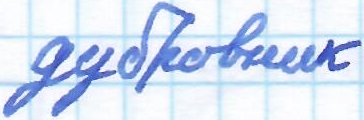дубровник
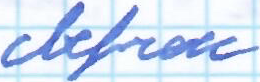сверчок
